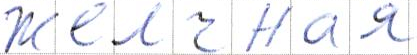желчная
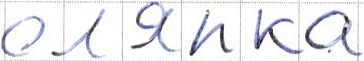оляпка
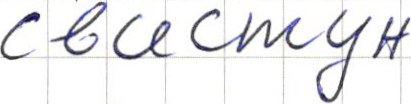свистун
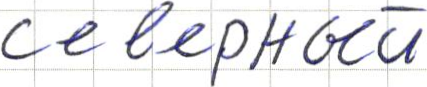северный
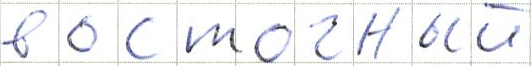восточный
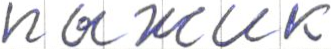пыжик
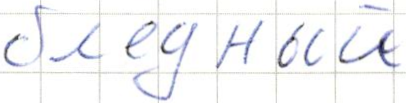бледный
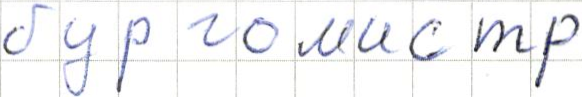бургомистр
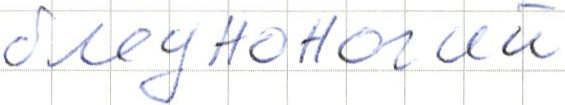бледноногий
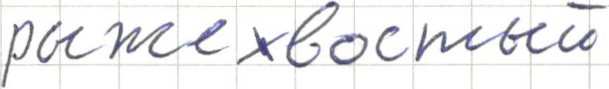рыжехвостый
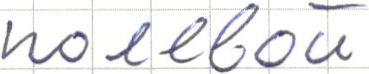полевой
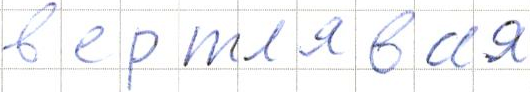вертлявая
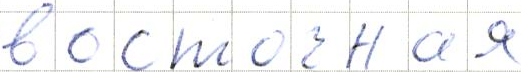восточная
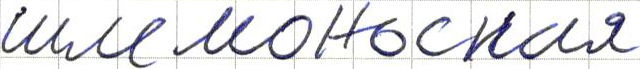шлемоносная
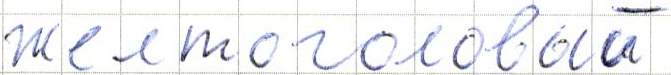желтоголовый
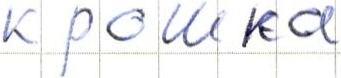крошка
